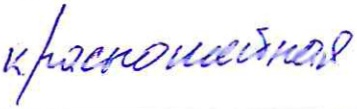красношейная
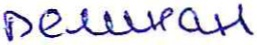пеликан
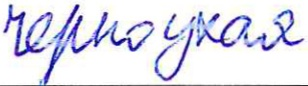черноухая
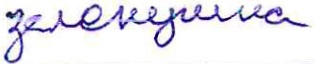зеленушка
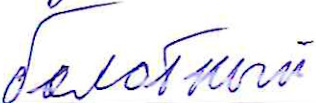болотный
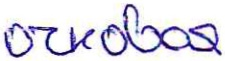очковая
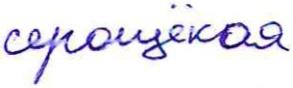серощёкая
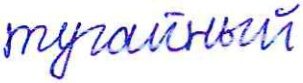тугайный
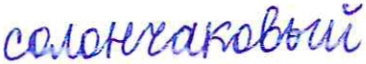солончаковый
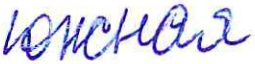южная
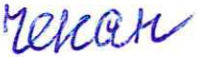чекан
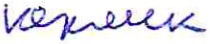кеклик
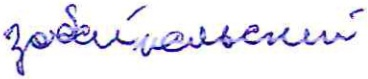зобайкельский
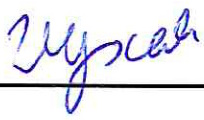глухая
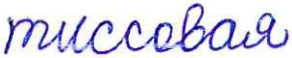тиссовая
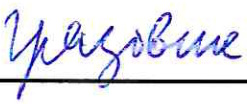грязовик
